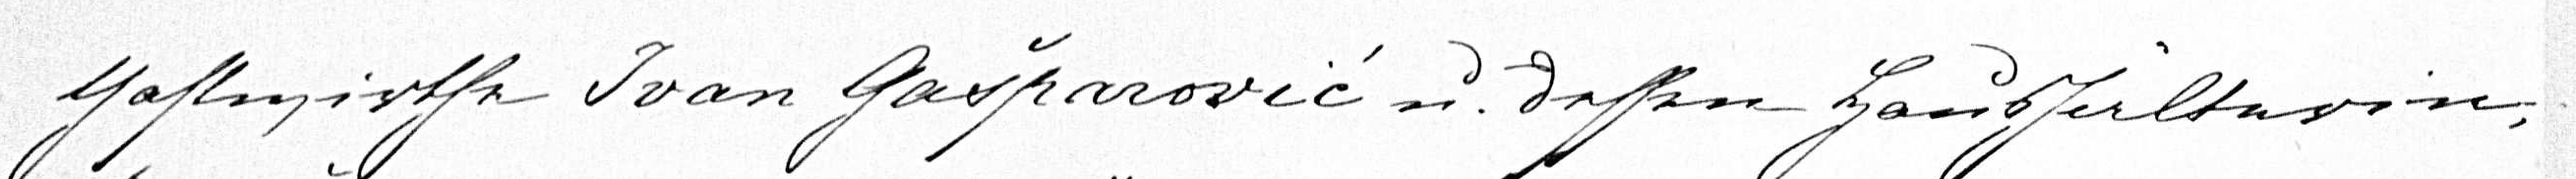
Gastwirthe Ivan Gašparović u. dessen Haushälterin,
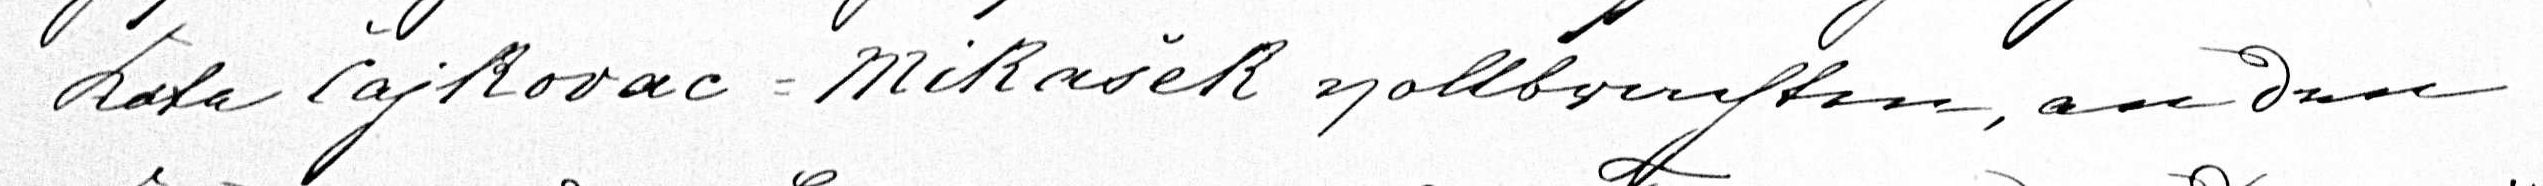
Rota Čajkovac – Mikašek vollbrachten, an den
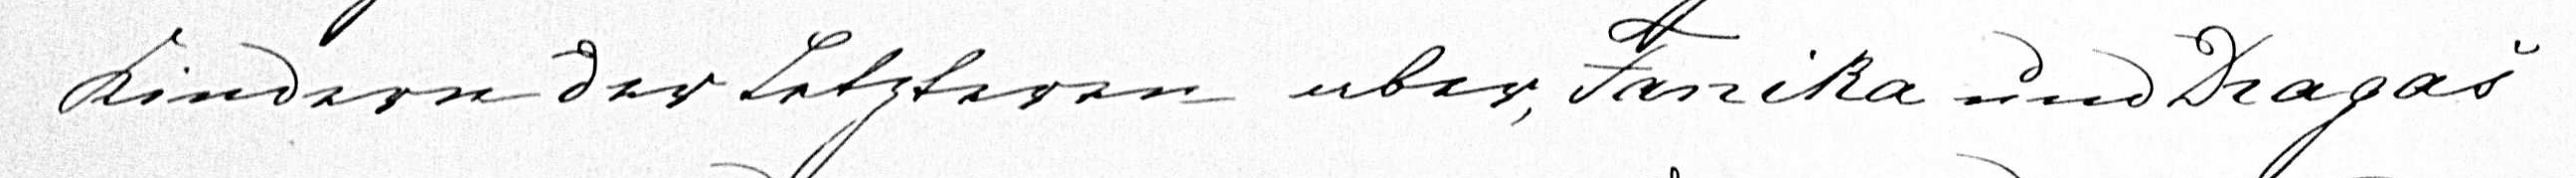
Kindern der Letzteren aber, Faszika und Dragaš
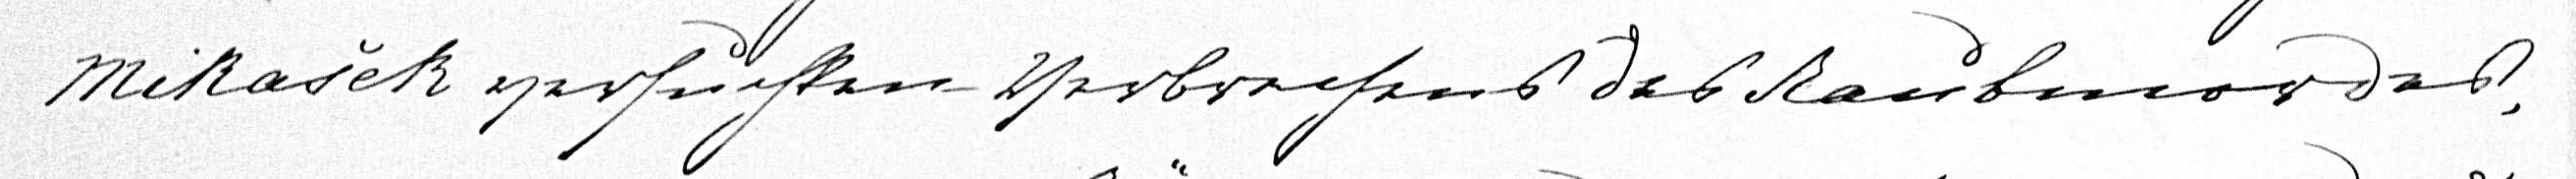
Mikašek versuchten – Verbrechens des Raubmordes,
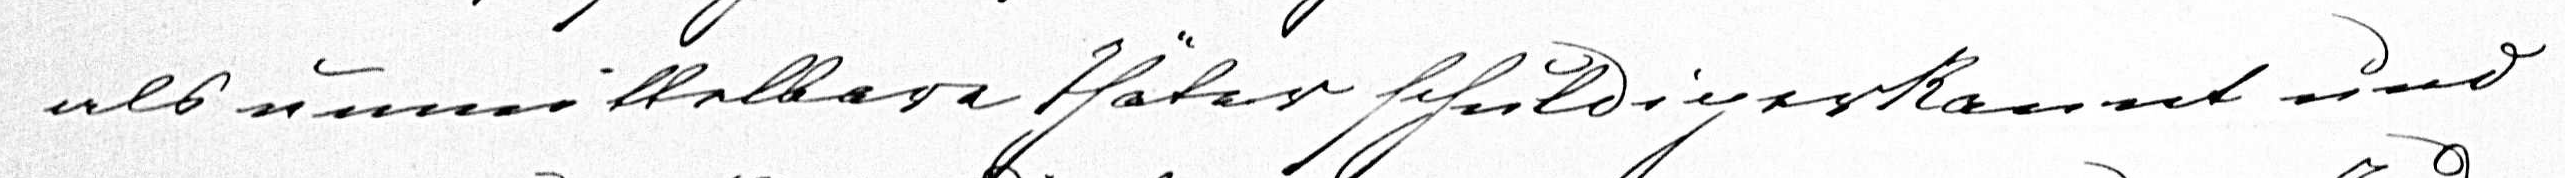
als unmittelbare Thäter schuldig erkannt und
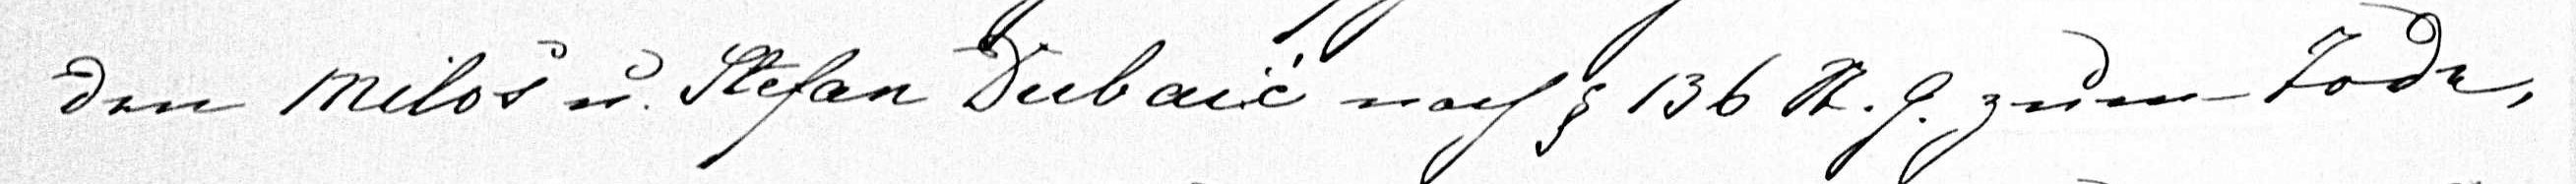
den Miloš
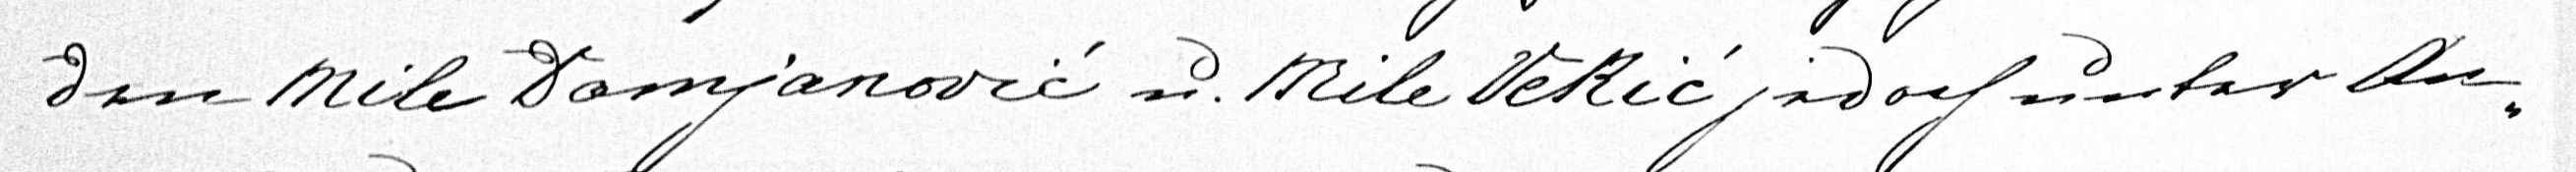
Damjanović u. Mile Vekić jedoch unter An¬
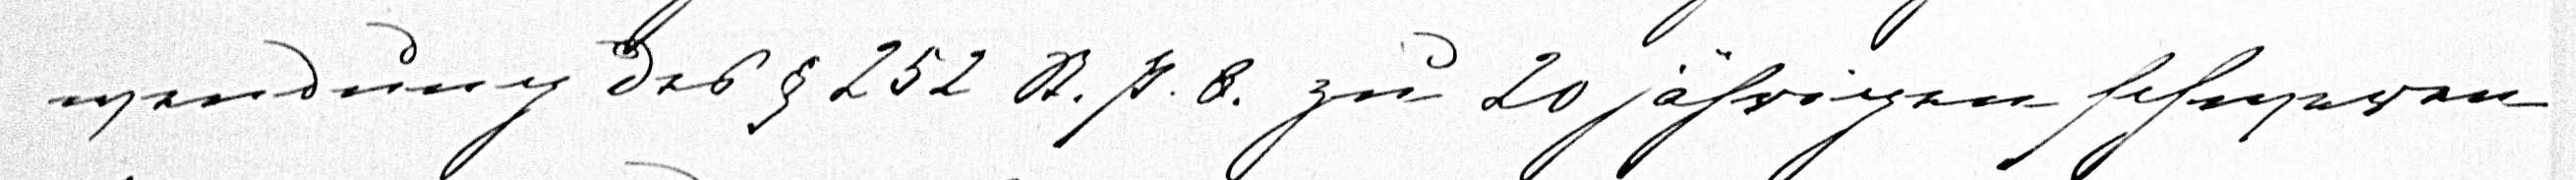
wendung des §252 St. G. B. zu 20jährigen schweren
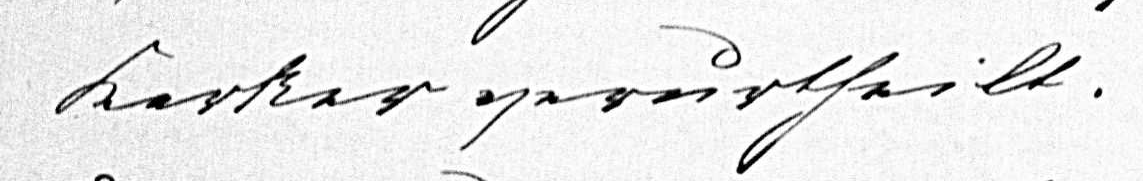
Kerker verurtheilt.
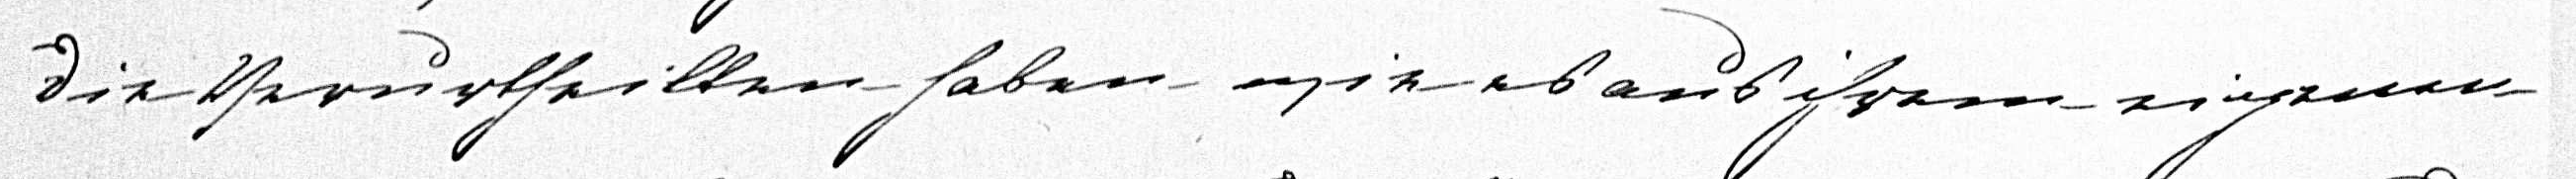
Die Verurtheilten haben wie es aus ihrem
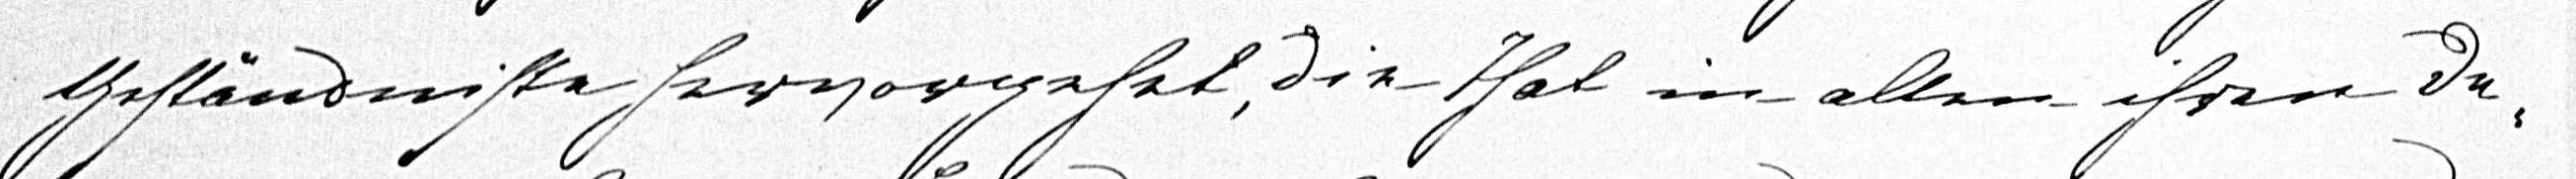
Geständeiste hervorgehet, die That in alten ihrem De¬
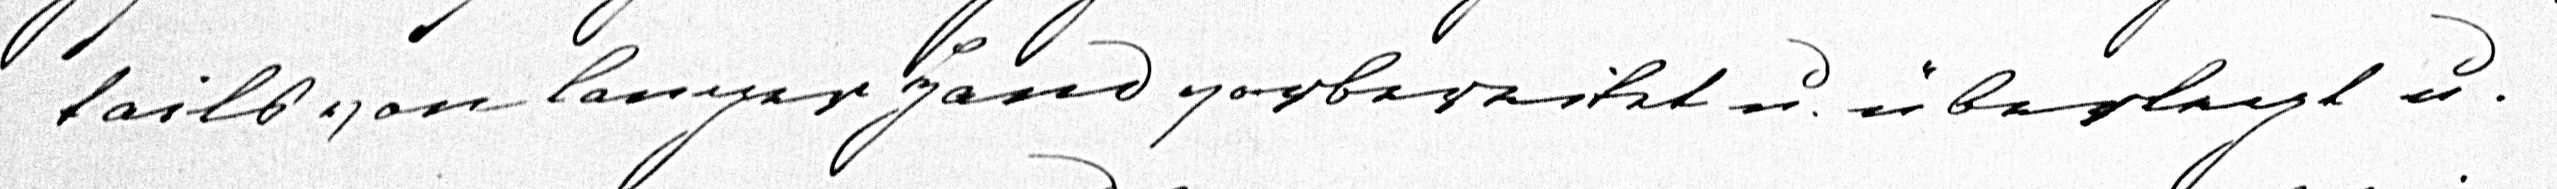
tails von langer Hand vorbereitet u. überlegt u.
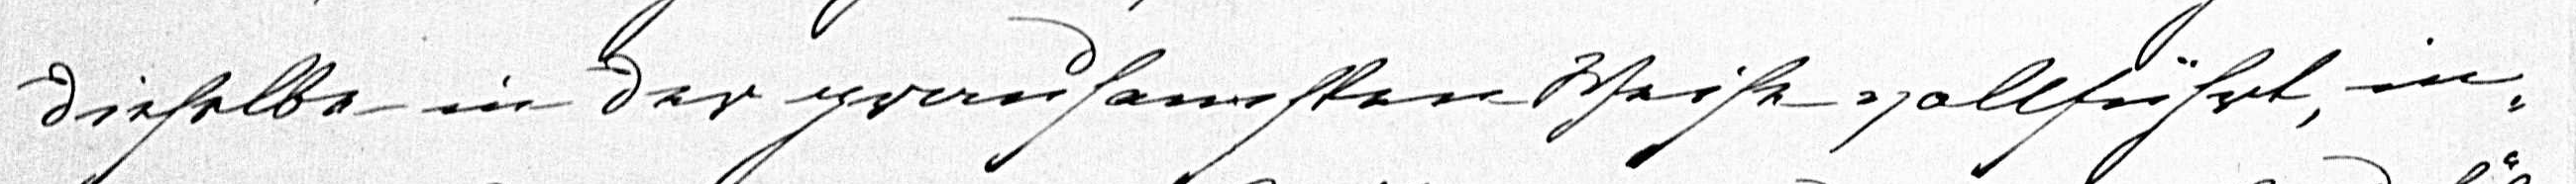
dieselbe in der grausamsten Weise vollführt, in¬
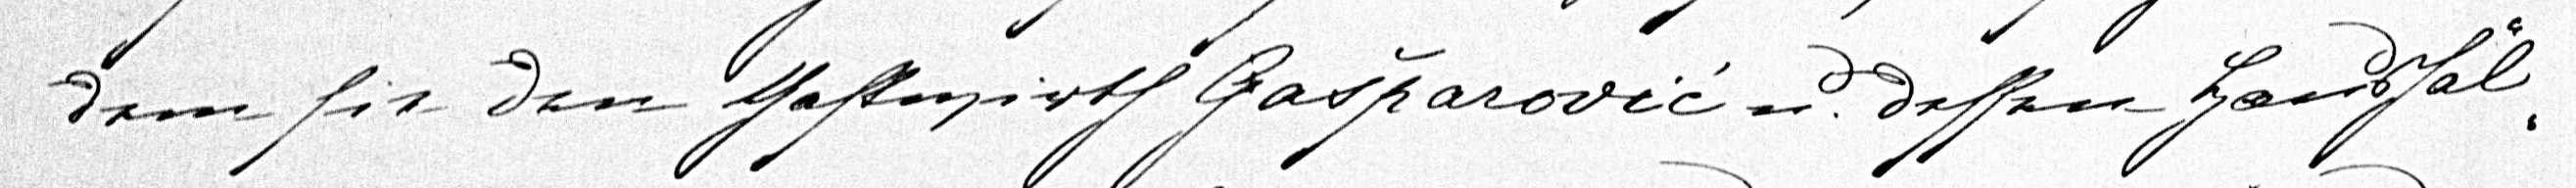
dem sie den Gastwirth Gašparović u. dessen Haushal¬
